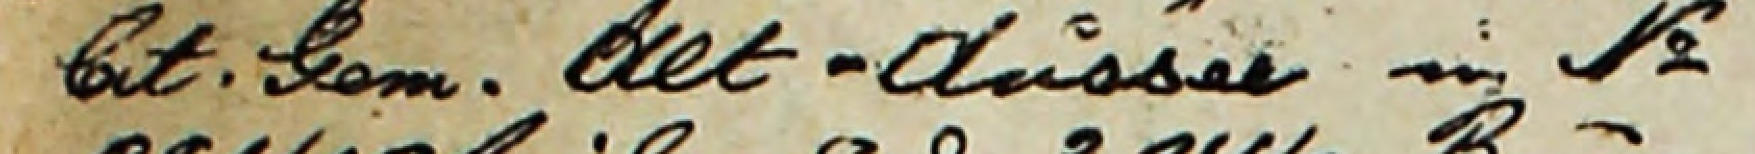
bit. Gem. Alt - Aussee in No
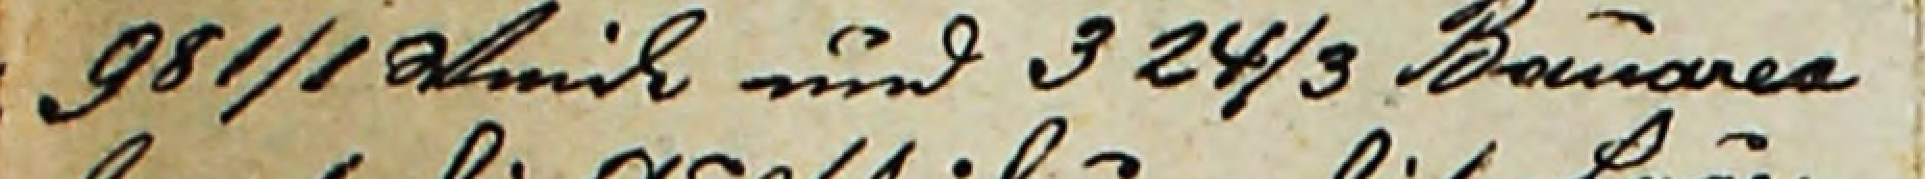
981/1 Weide und 324/3 Bauarea
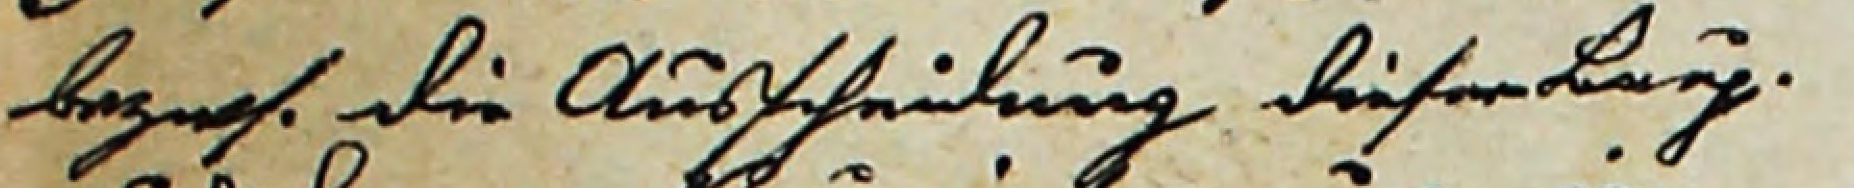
bezech. Die Ausscheidung diesen Baup.
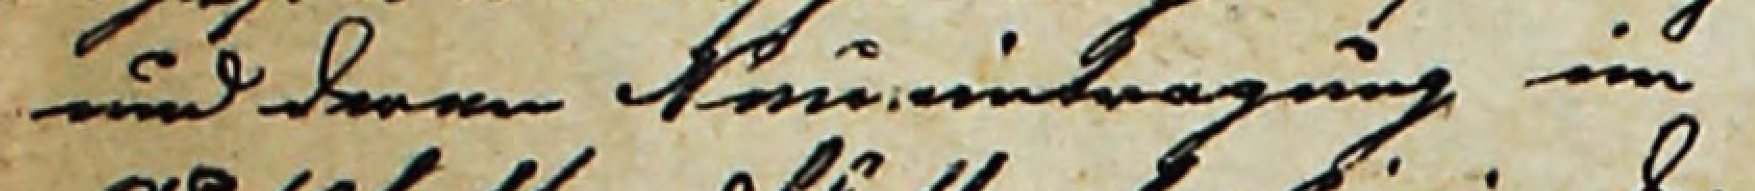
und deren Neueintragung im
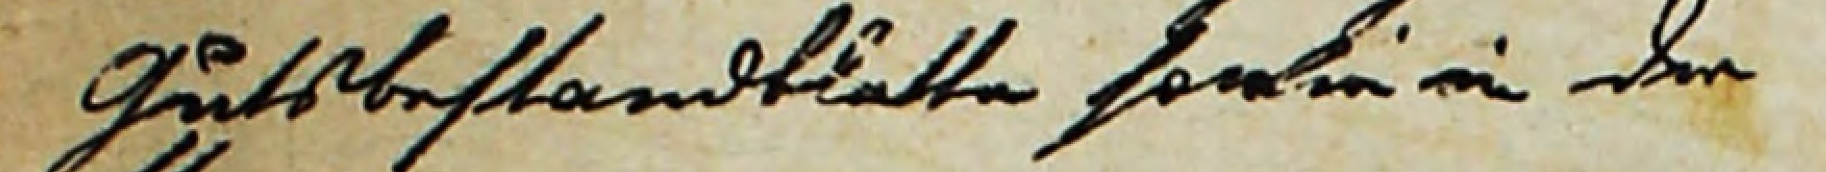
Gutsbestandblatte sowie in der
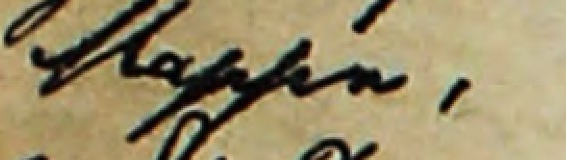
Kappe,
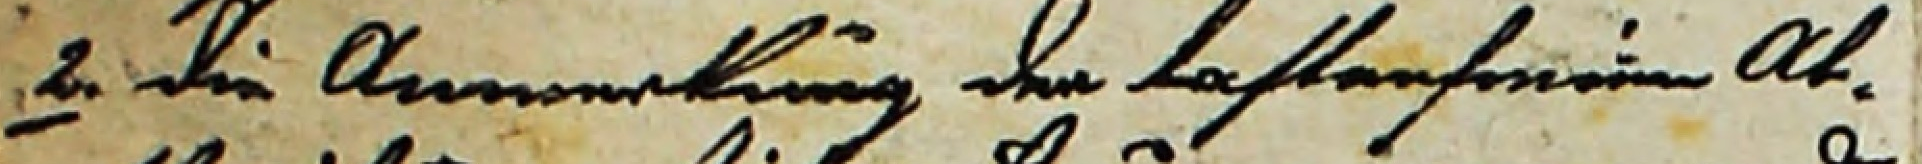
2. Die Anmerkung der lastenfreien Ab=
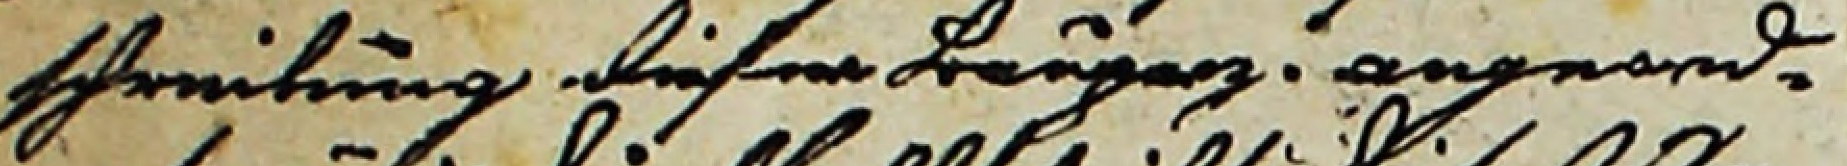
schreibung diesen Bauparz. angeord=
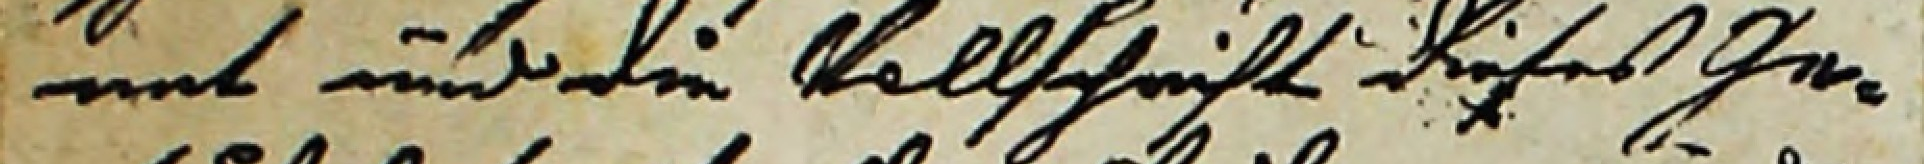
net und die Vollschrift dieses Ge=
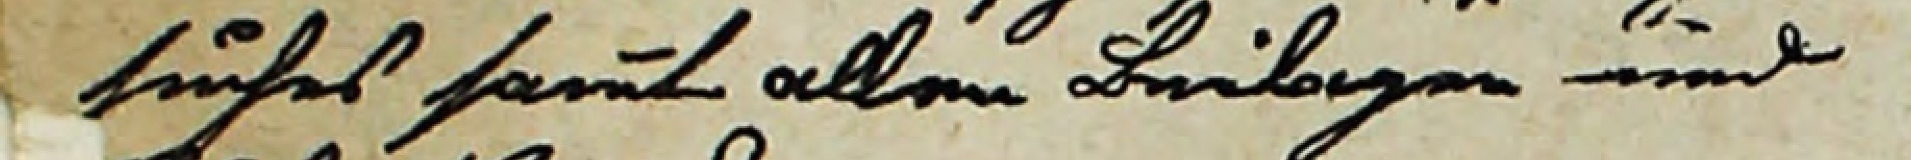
suches sammt allen Beilagen und
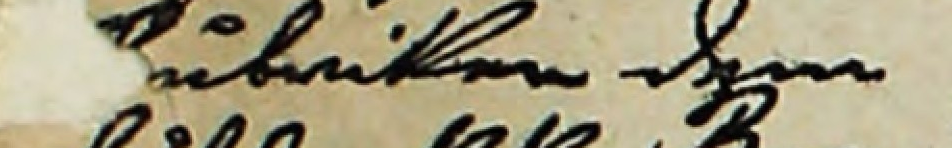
Rubriken dem
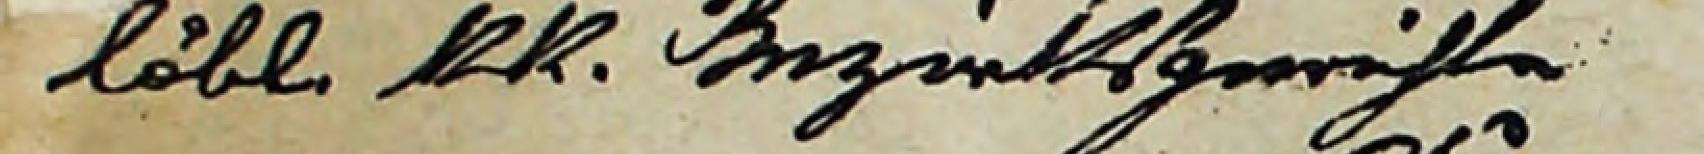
löbl. kk. Bezirksgerichte
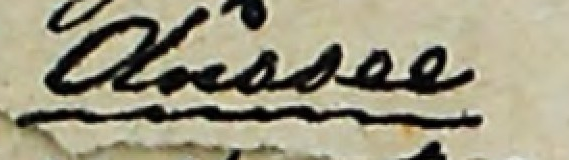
Aussee
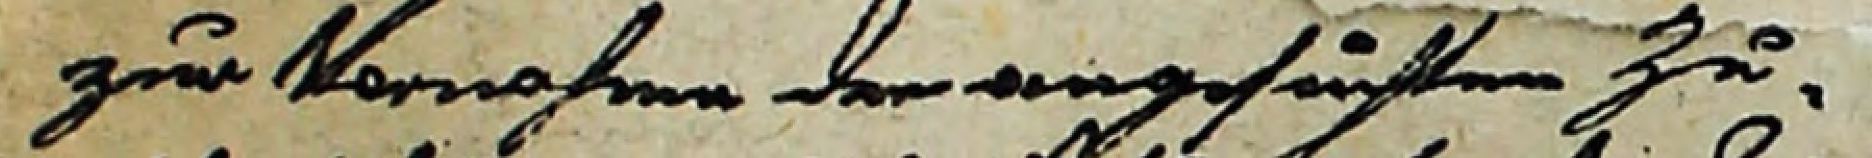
zur Vornahme den angesuchten Zu„
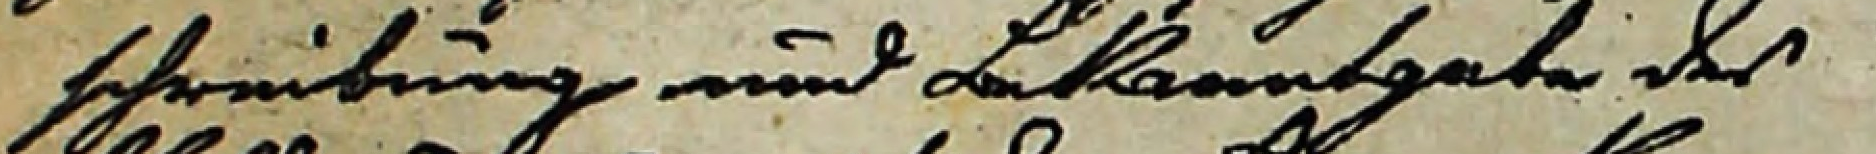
schreibung und Bekanntgabe des
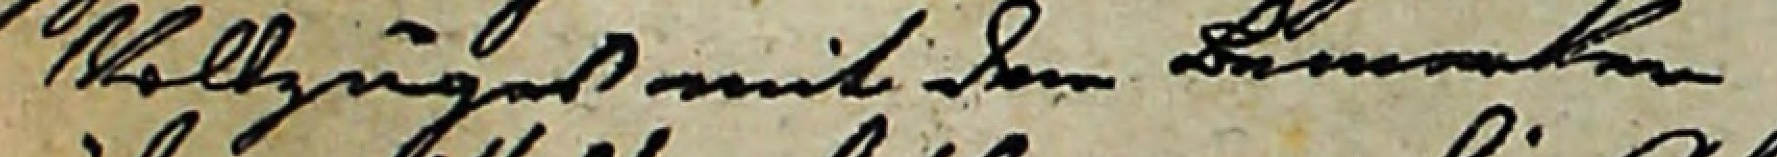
Vollzuges mit dem Benennken
